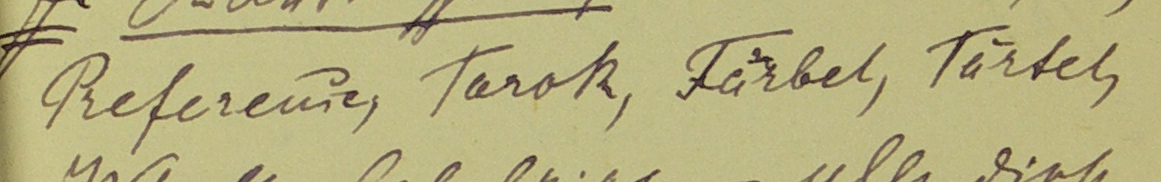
Preference, Tarok, Färbet, Tartel,
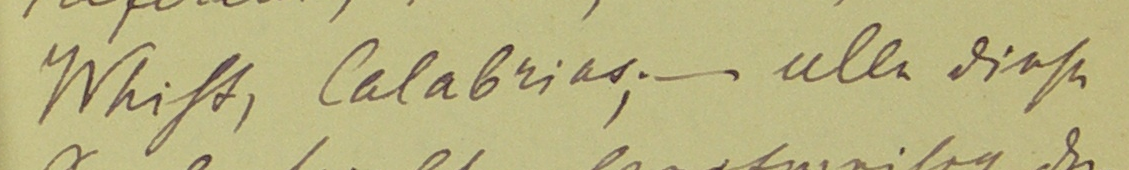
Whist, Calabrias;-alle diese
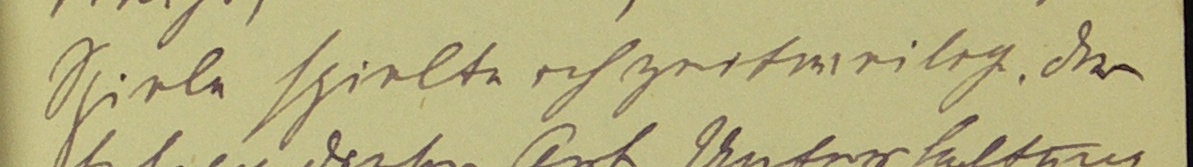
Spiele spielte ich zeitweilig. Der
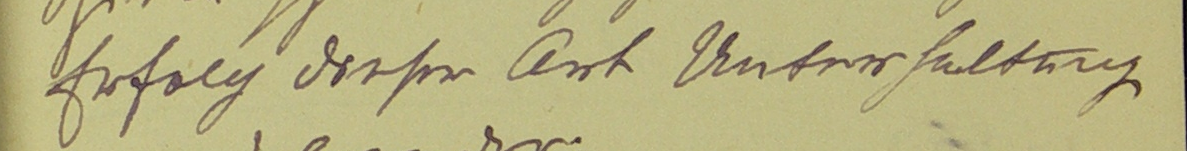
Erfolg dieser Art Unterhaltung
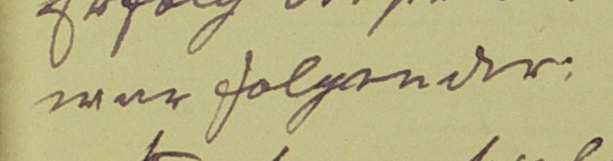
war folgender:
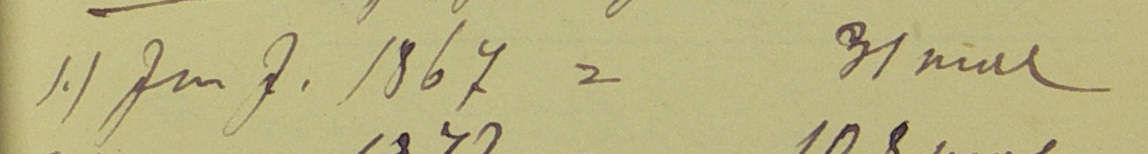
1.) Im Jahr 1867 = 31 mal
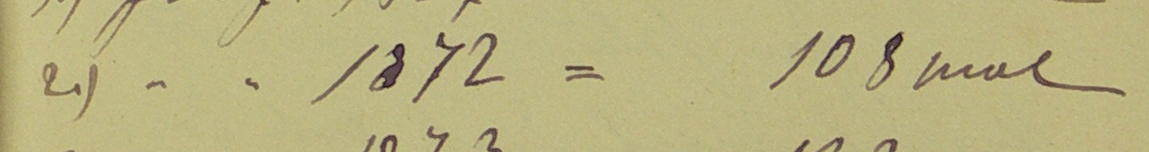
2.) * 1872 = 108 mal
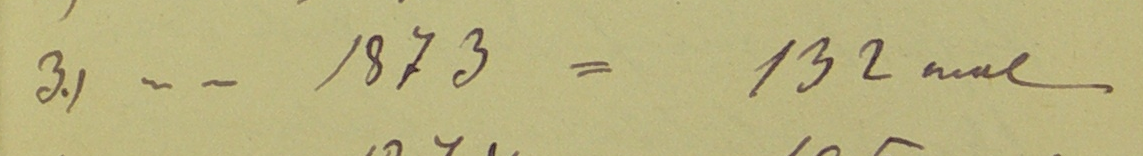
3.) * 1873 = 132 mal
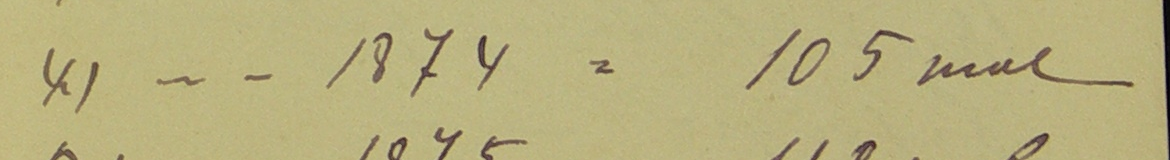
4.) * 1874 = 105 mal
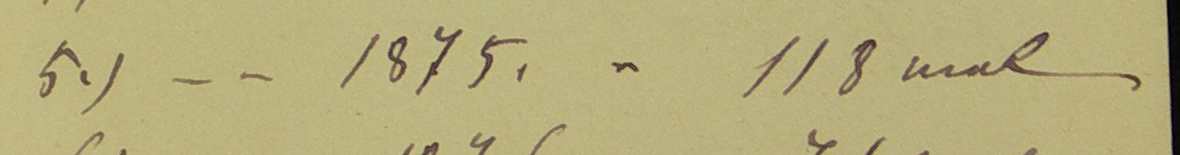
5.) * 1875 = 118 mal
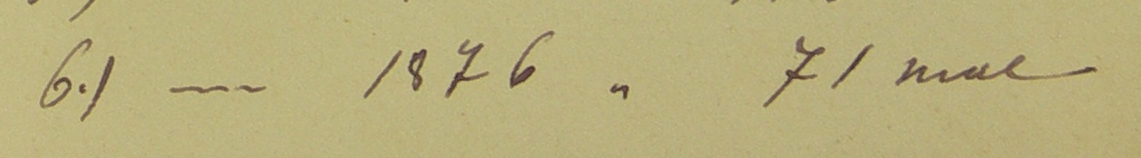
6.) * 1876 = 71 mal
